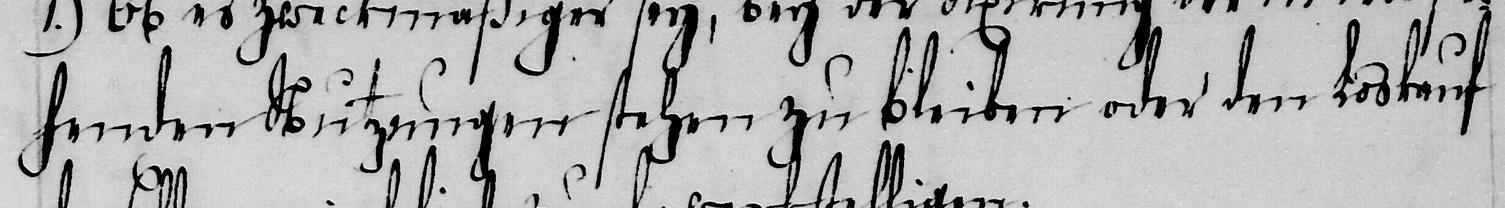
ehenden Nutzungen stehen zu bleiben oder den Loskauf
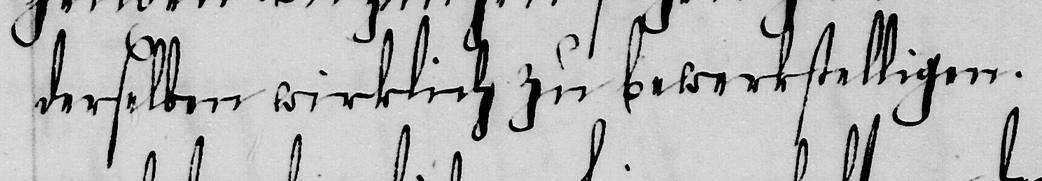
derselben wirklich zu bewerkstelligen.
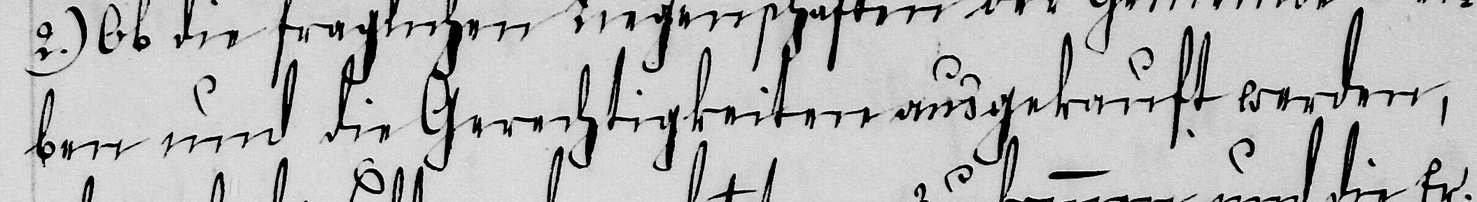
ben und die Gerechtigkeiten ausgekauft werden,
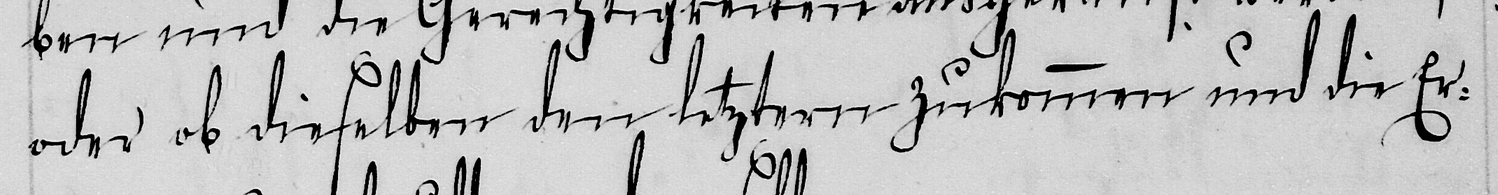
oder ob dieselben den letztern zukommen und die Er¬
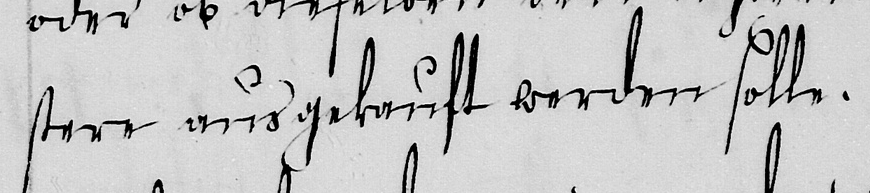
stere ausgekauft werden solle.
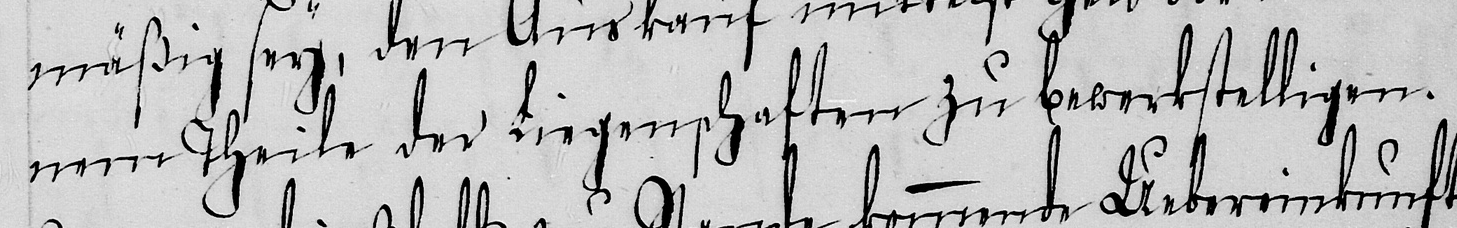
nem Theile der Liegenschaften zu bewerkstelligen.
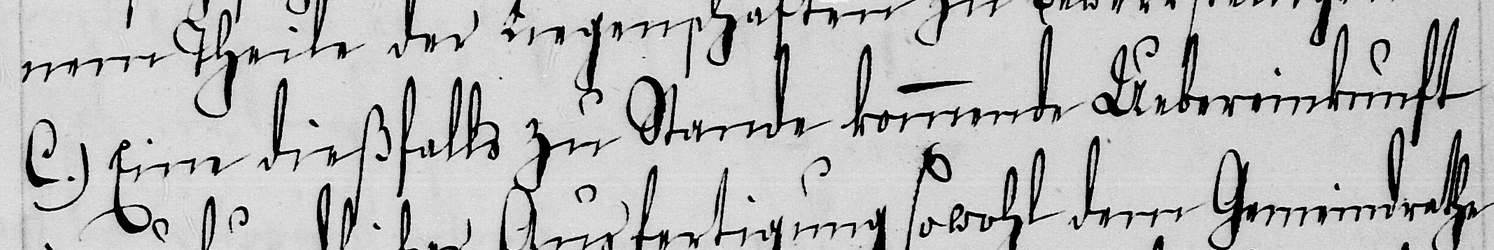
C.) Eine dießfalls zu Stande kommende Uebereinkunft
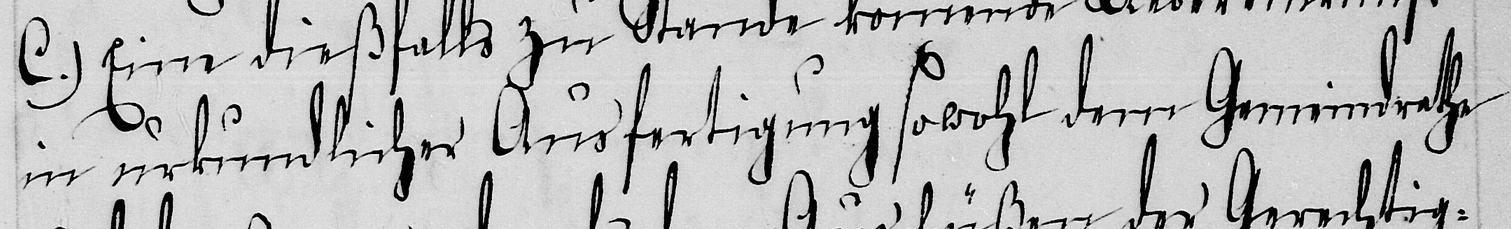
in urkundlicher Ausfertigung sowohl dem Gemeindrathe
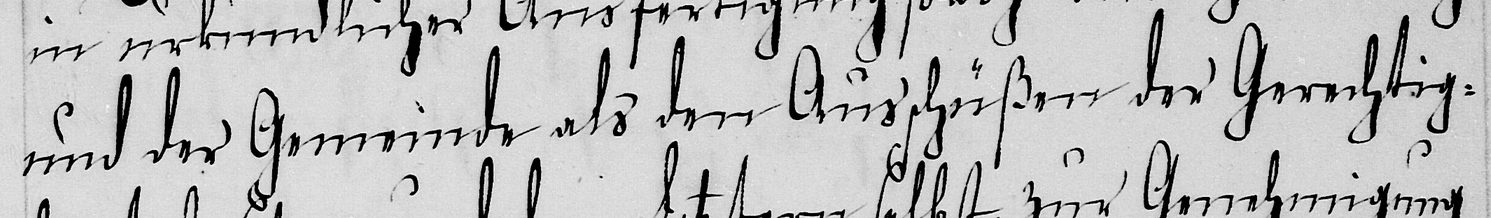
und der Gemeinde als den Ausschüßen der Gerechtig¬
